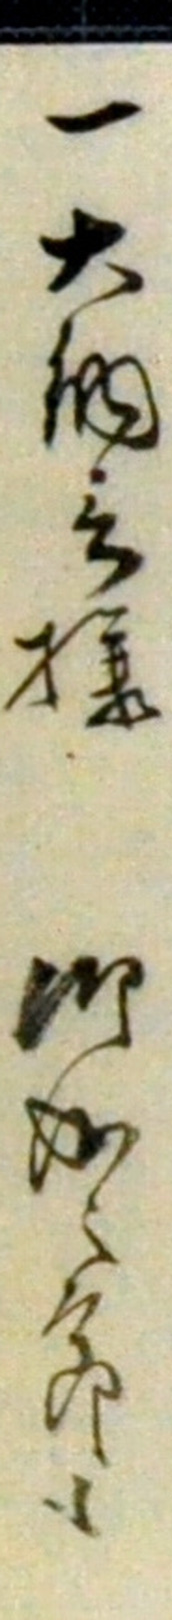一大納言様御成之節も
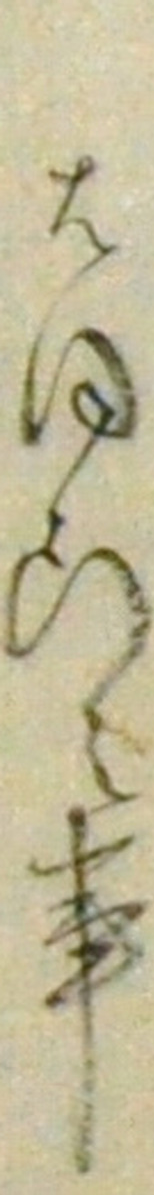右同断之事

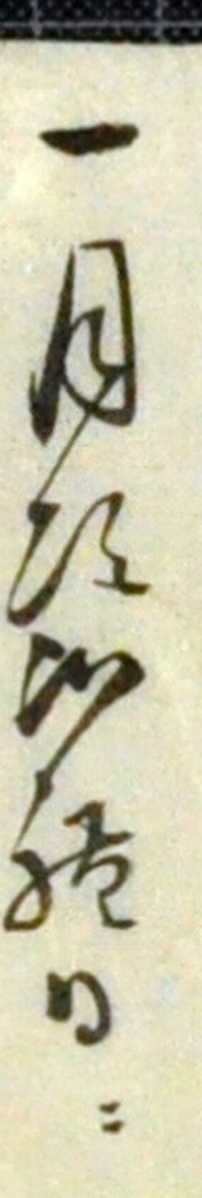一月次御礼日ニ
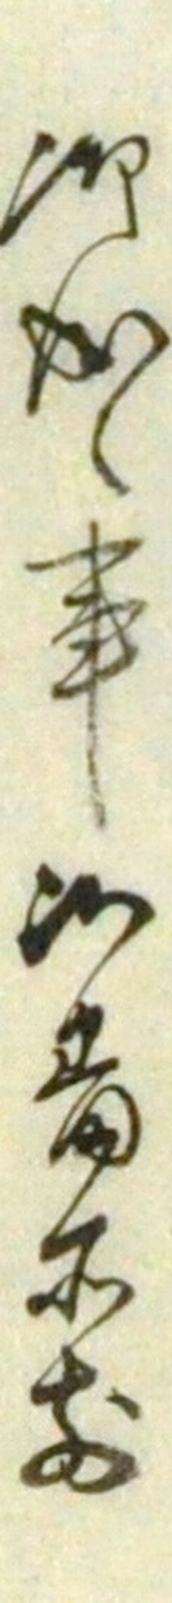御成之事御番所前
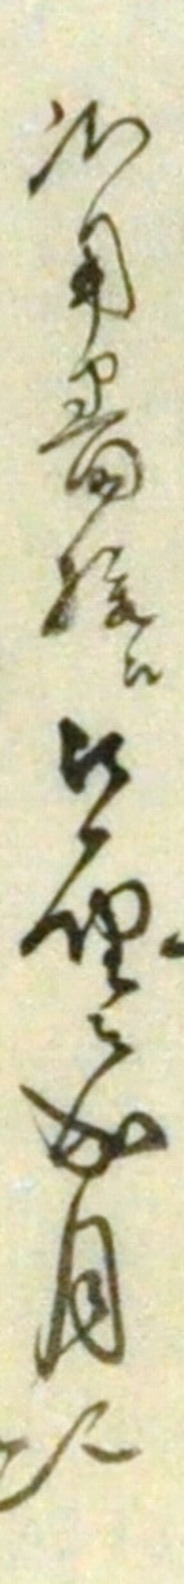御用番様江御届ニ成月次
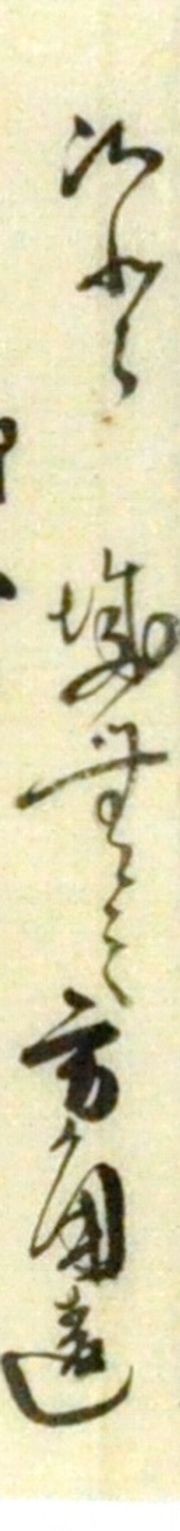御登城無之方角違
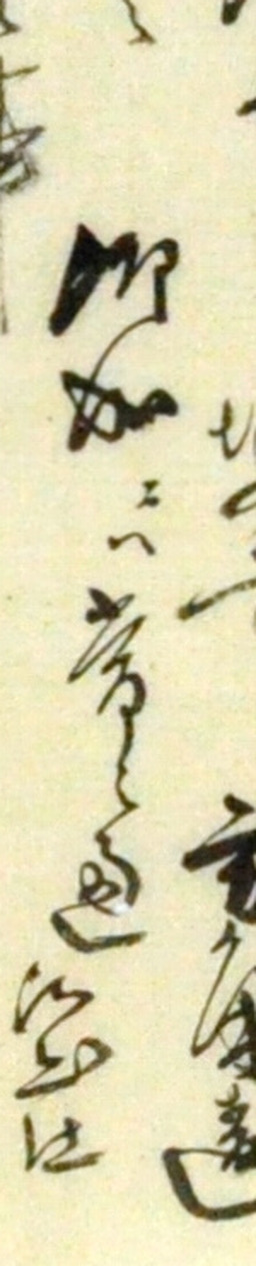之御成ニハ常之通御出仕
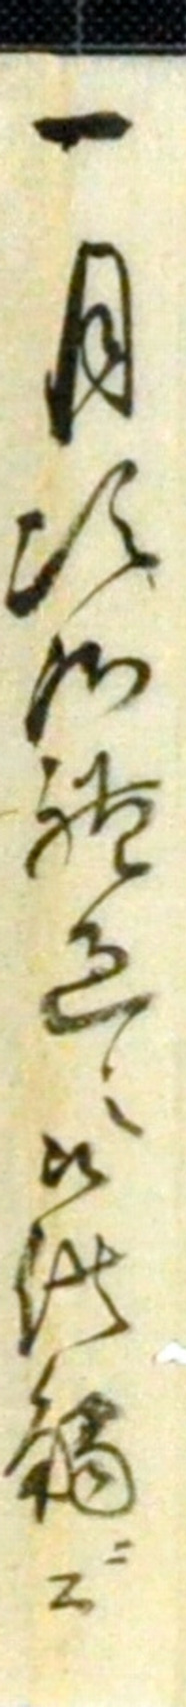一月次御礼過之御供触ニ而
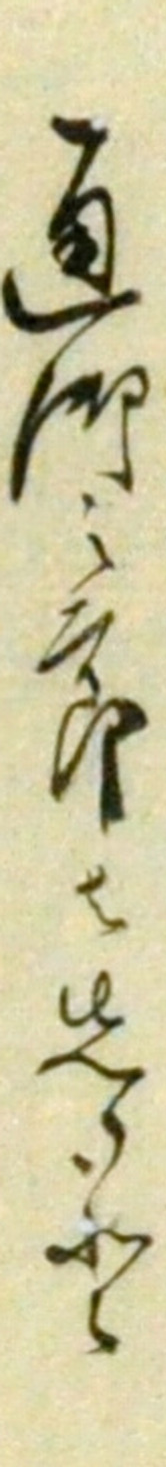通御之節は先ツ登
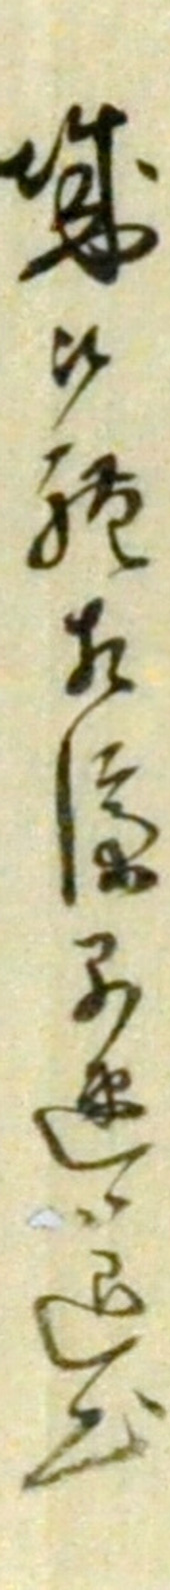城御礼相済早速御退出
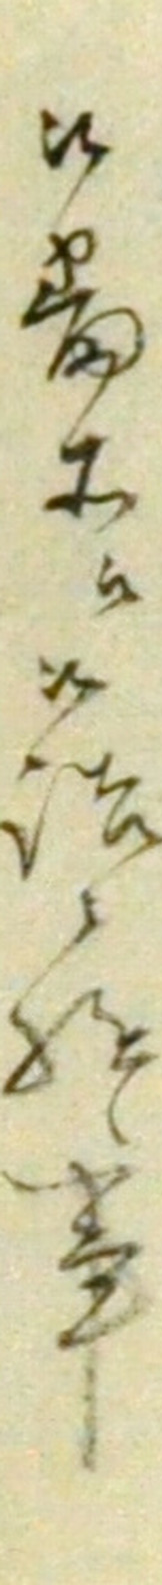御番所江御詰被遊候事

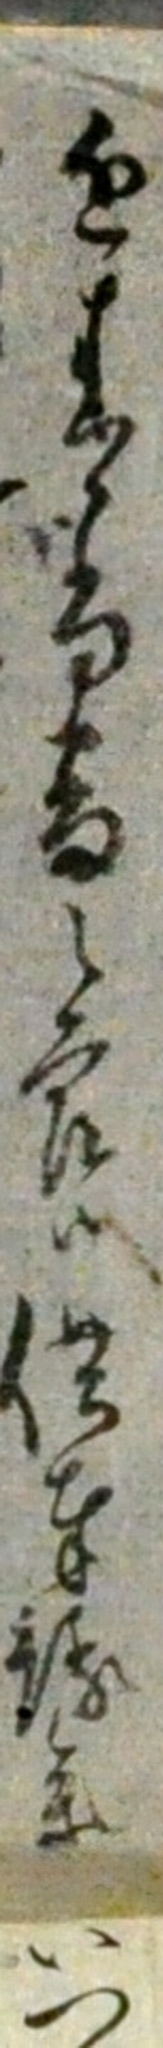近来御当番之節ハ供奉予参
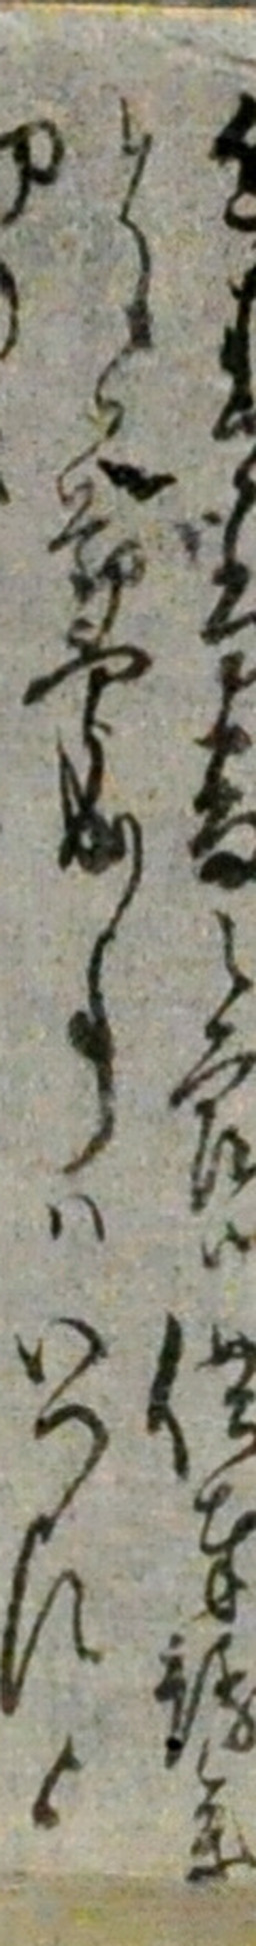とも御勤不被成事ハいつ頃ゟ
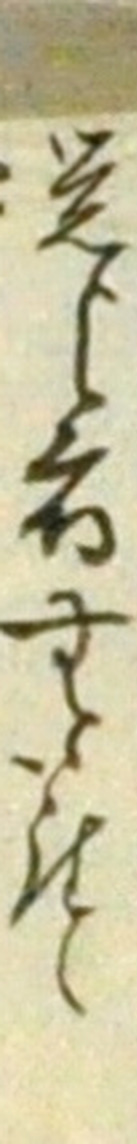覚申候者無御座候
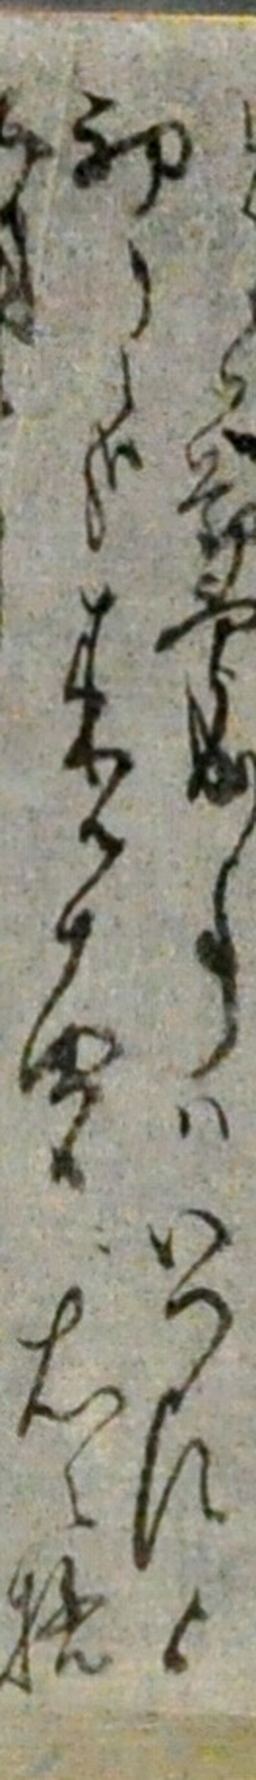初り候哉来ル十四日ニ右之格
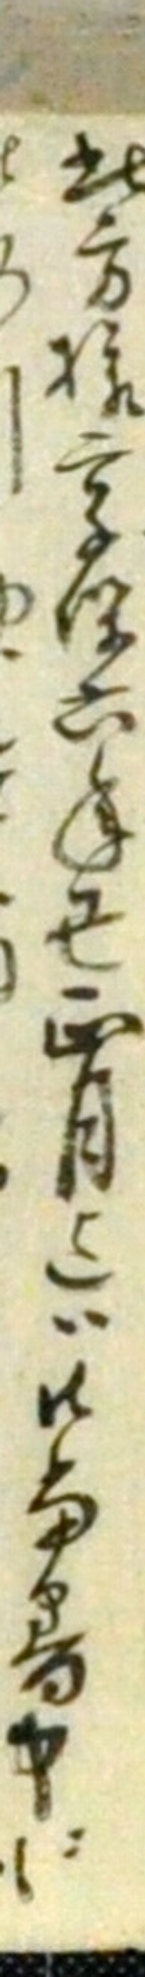此方様享保六年丑正月迄ハ御当番中ニも
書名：覚
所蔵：伊那市立高遠町図書館・合同会社AMANE
